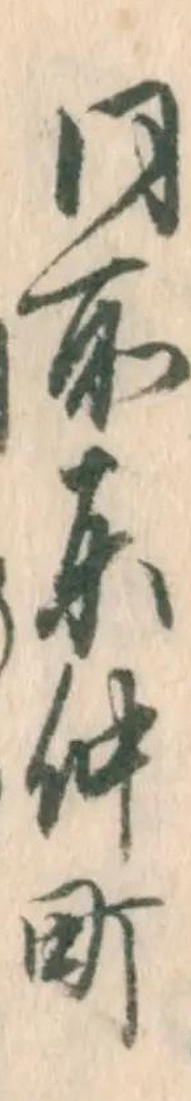同所東仲町
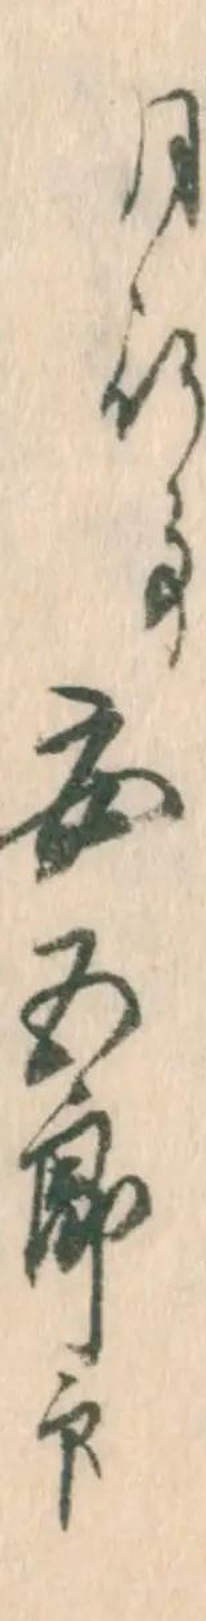月行事安五郎印
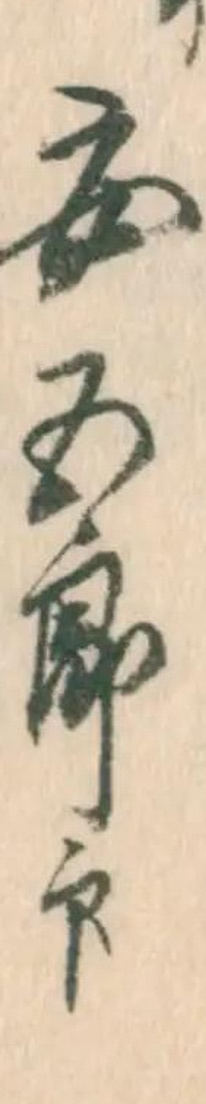月行事安五郎印
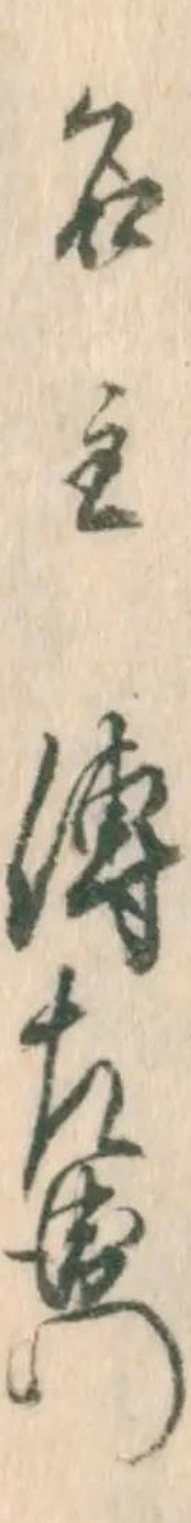名主伝左衛門
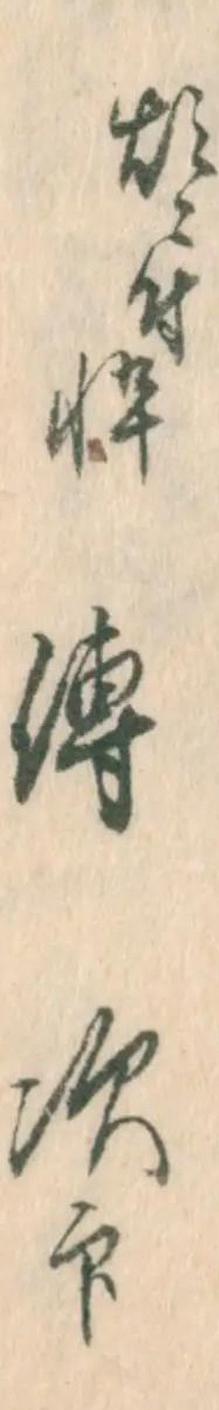煩ニ付倅伝次印

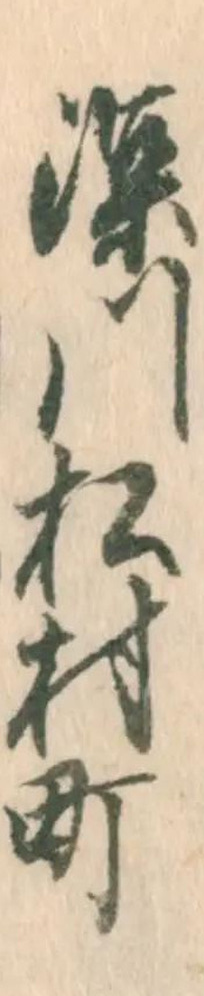深川松村町
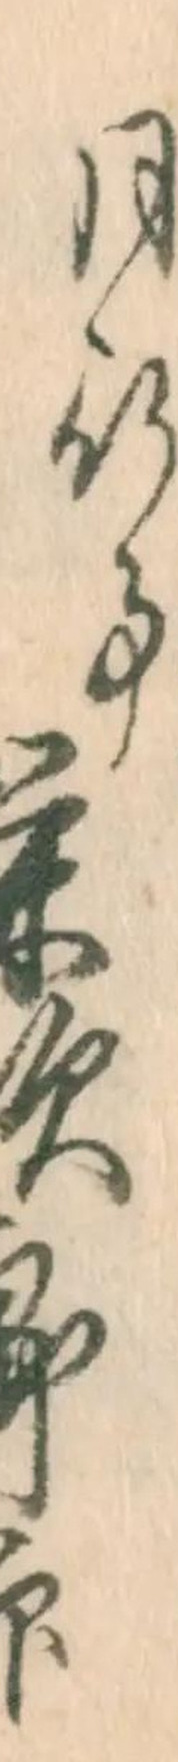月行事栄次郎印
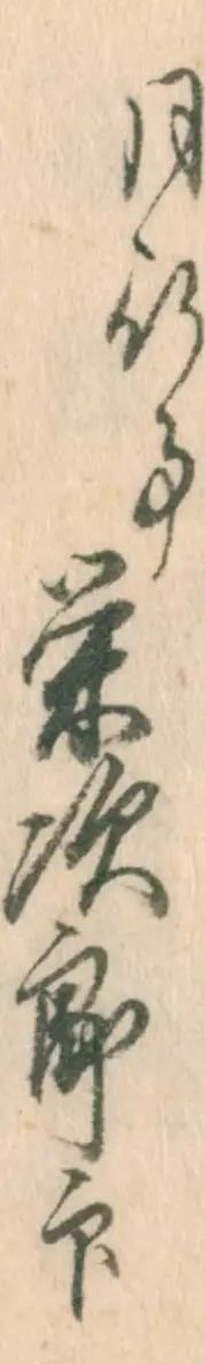月行事栄次郎印
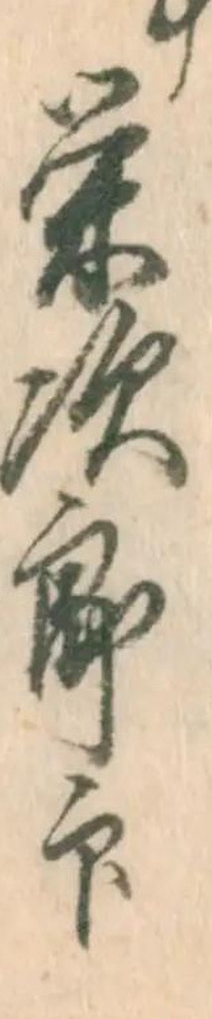月行事栄次郎印
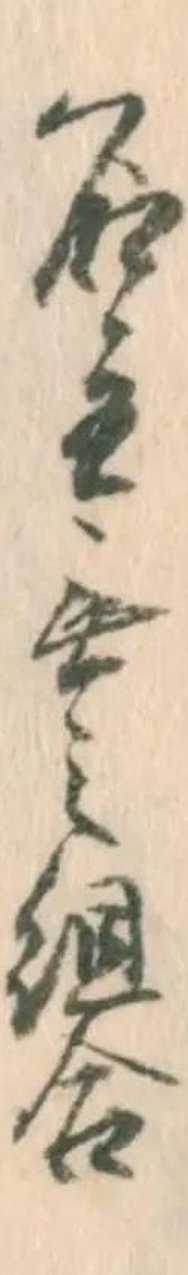名主無之組合
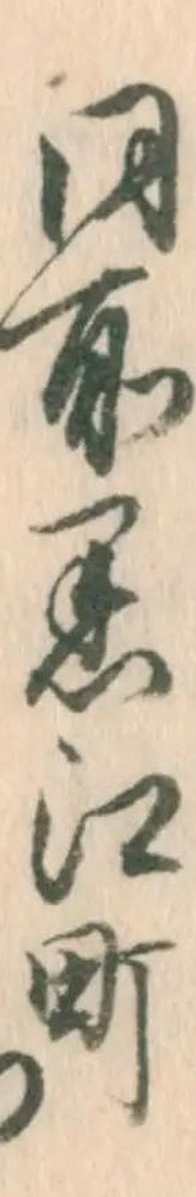同所黒江町
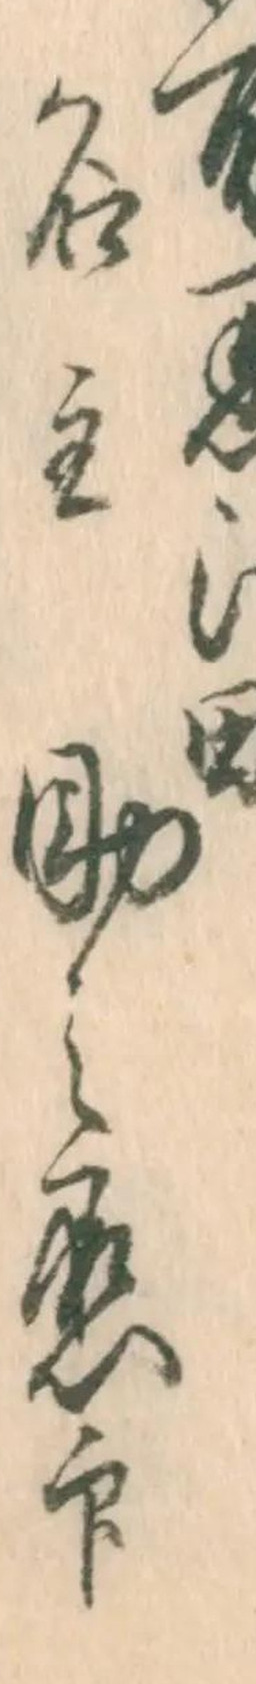名主助之丞印
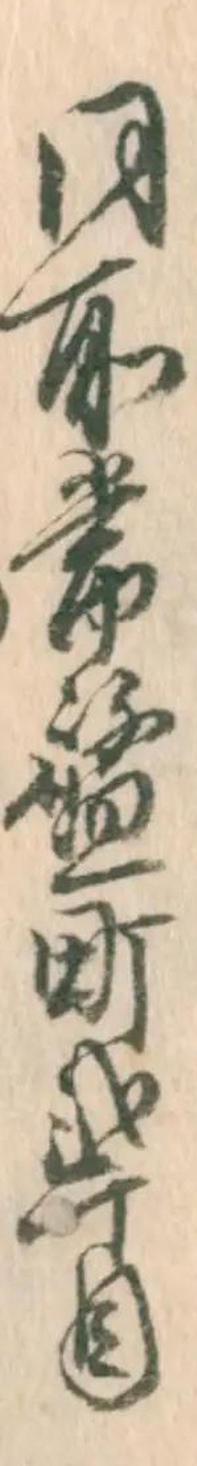同所常盤町弐丁目
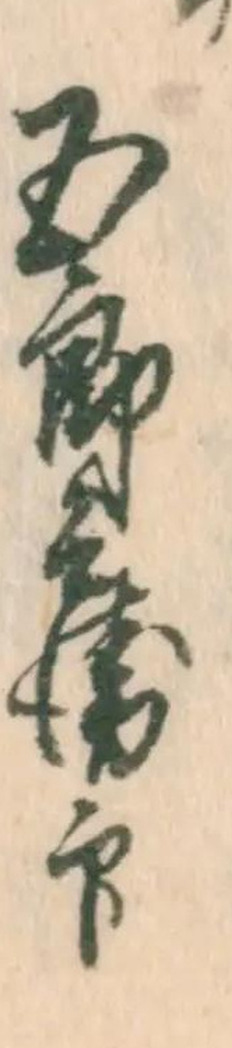月行事五郎兵衛印
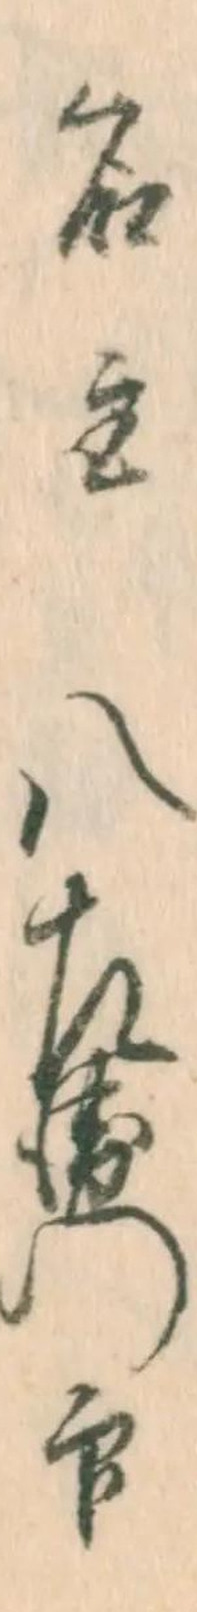名主八左衛門印
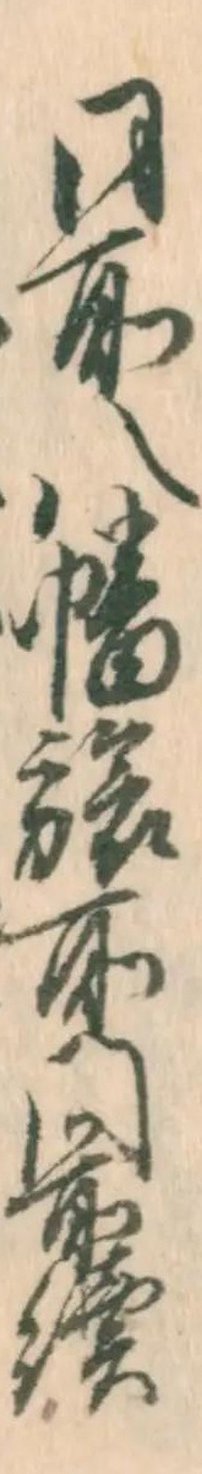同所八幡旅所同所続
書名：地震災書留 2巻. [2] 内表紙に「地震一件　安政二卯年十月」とあり
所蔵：国立国会図書館 National Diet Library, JAPAN
